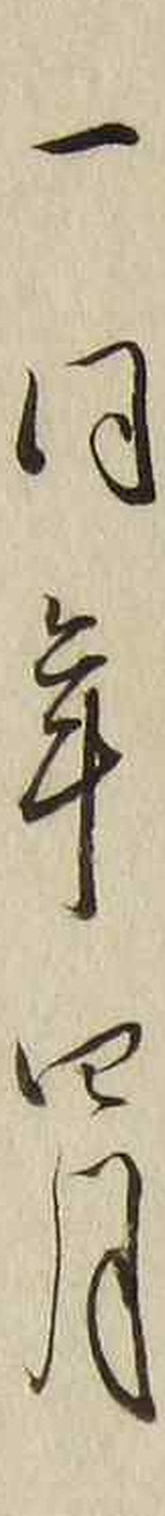一同年四月

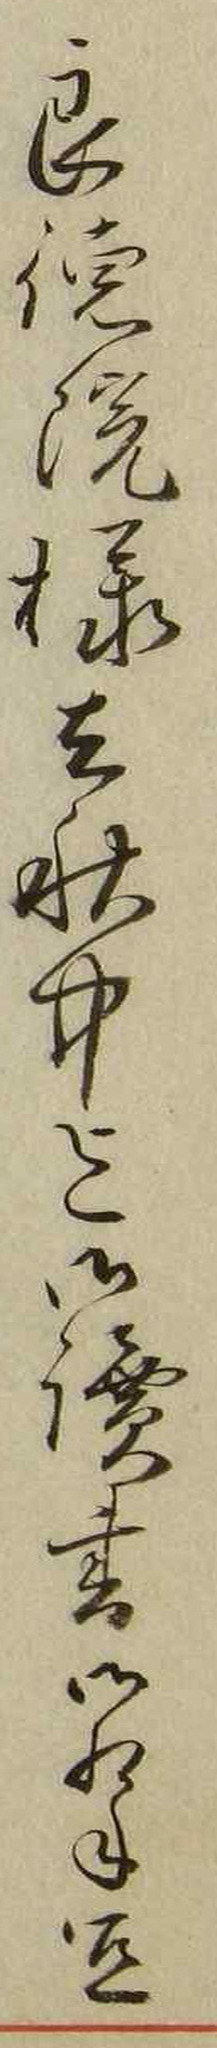良徳院様去秋中迄御読書御相手宜
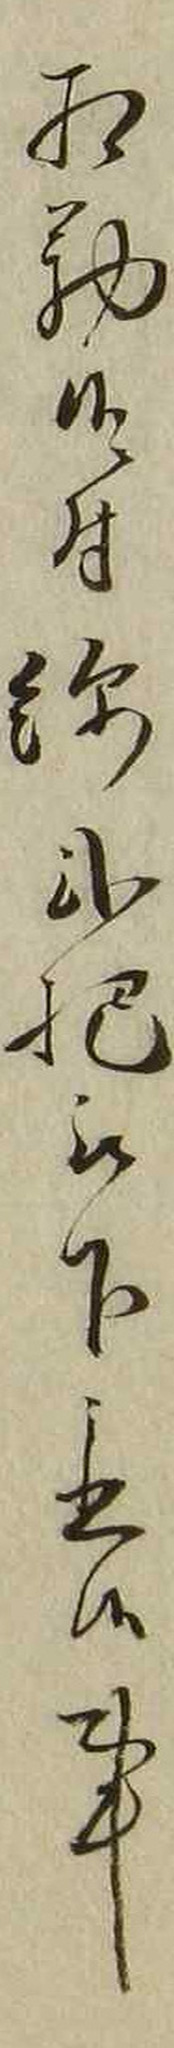相勤候に付綿二把被下置候事
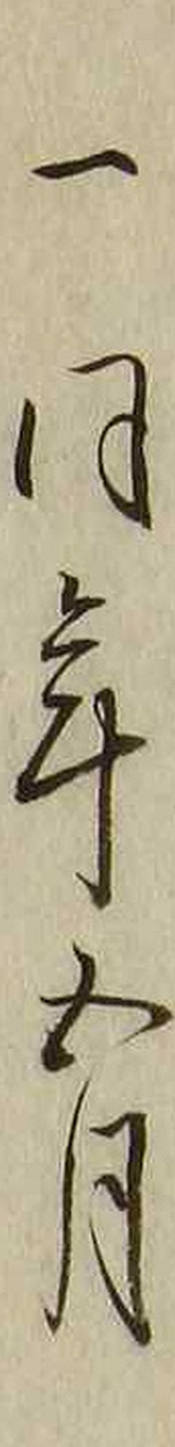一同年五月
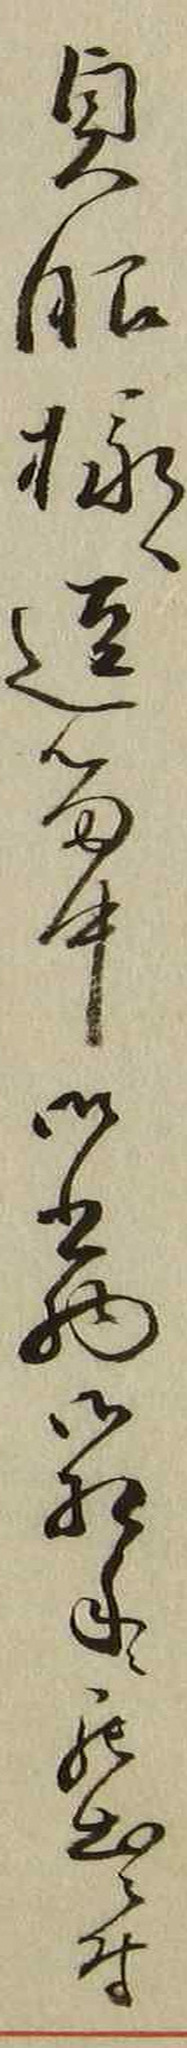貞昭様へ逗留中御書物御相手に罷出候に付
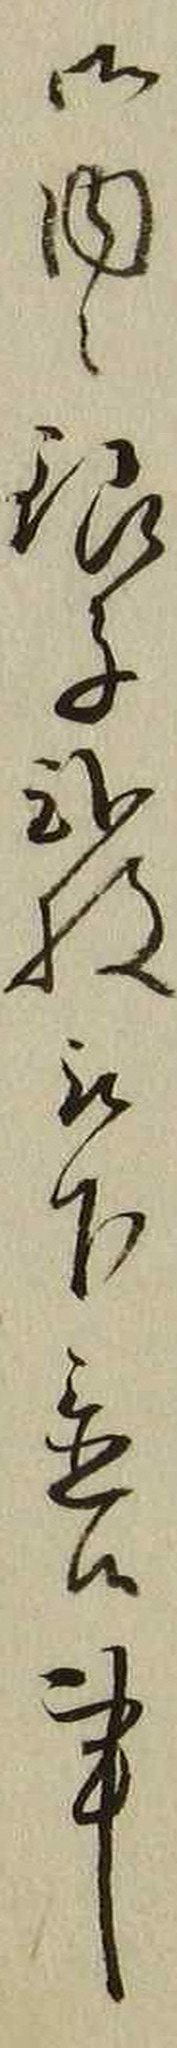御内々銀子弐枚被下置事
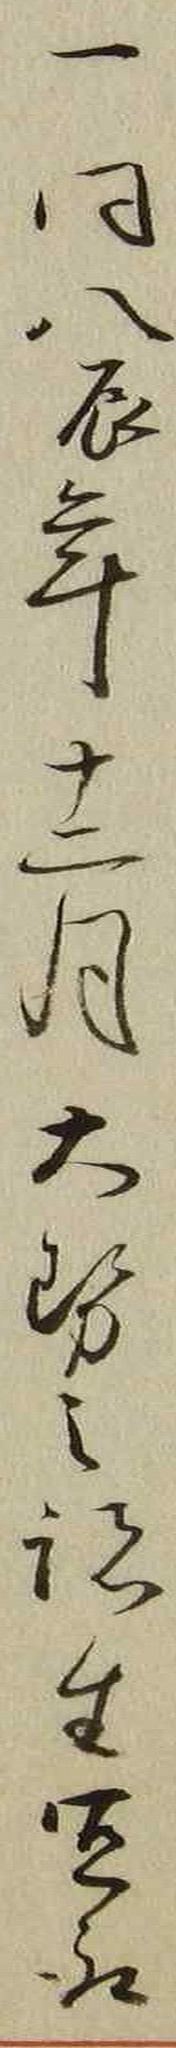一同八辰年十二月大勢之諸生宜取
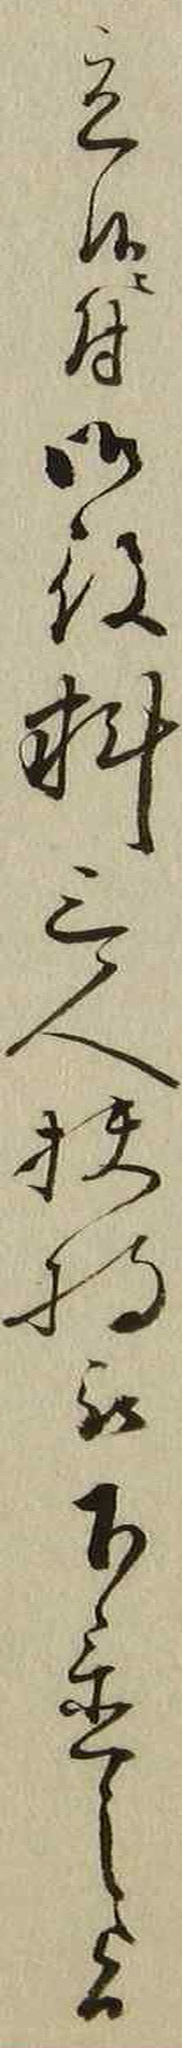立候に付御役料三人扶持被下置之旨
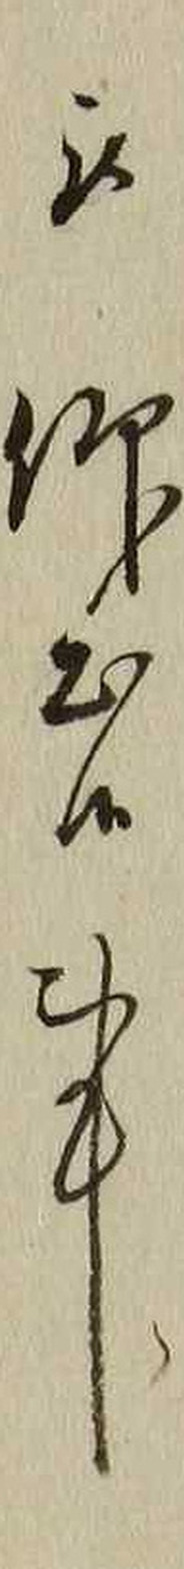被仰出候事
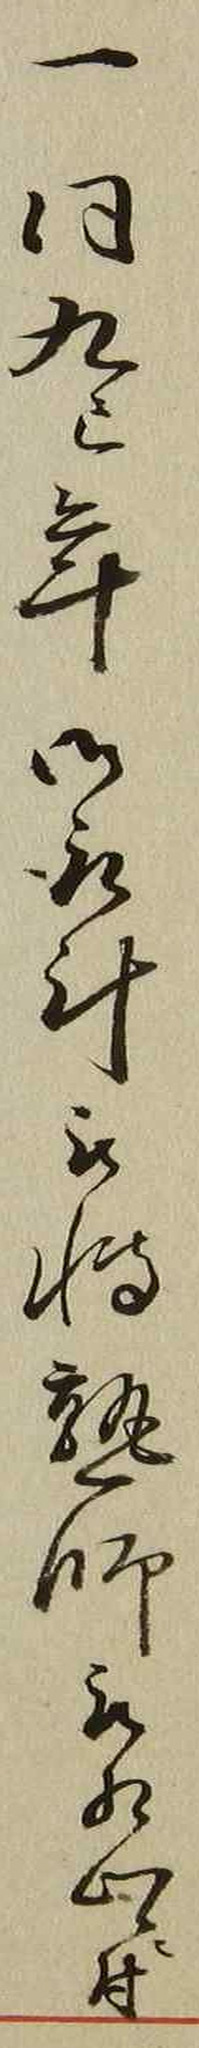一同九巳年御取計被転熟師被相止候に付
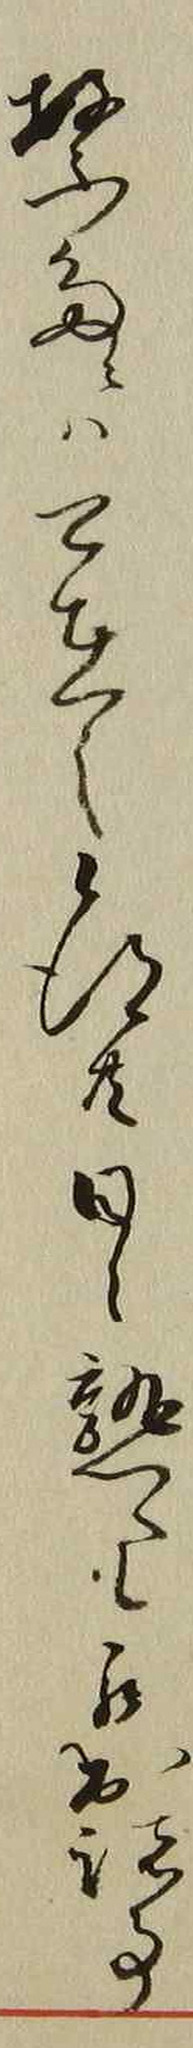繫多には可在之候得共日々塾へも罷出諸事
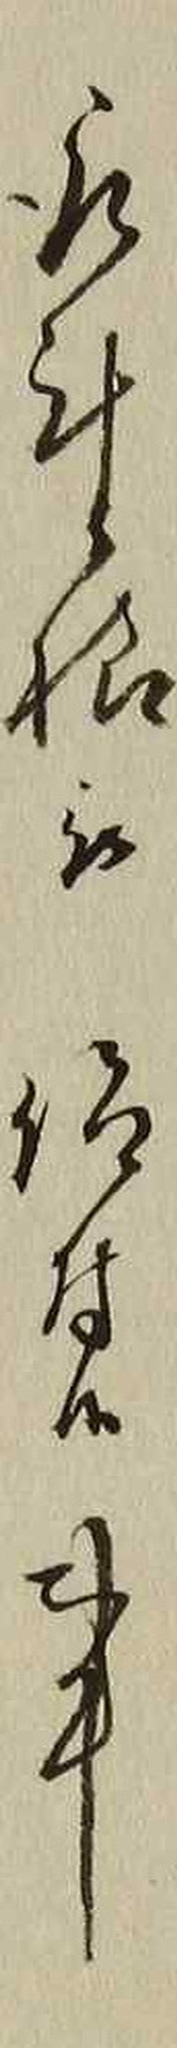取計候様被仰付候事
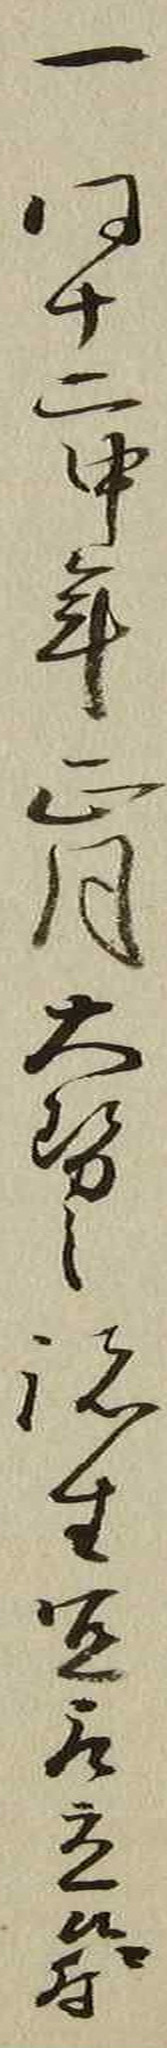一同十二申年正月大勢之諸生宜取立候に付
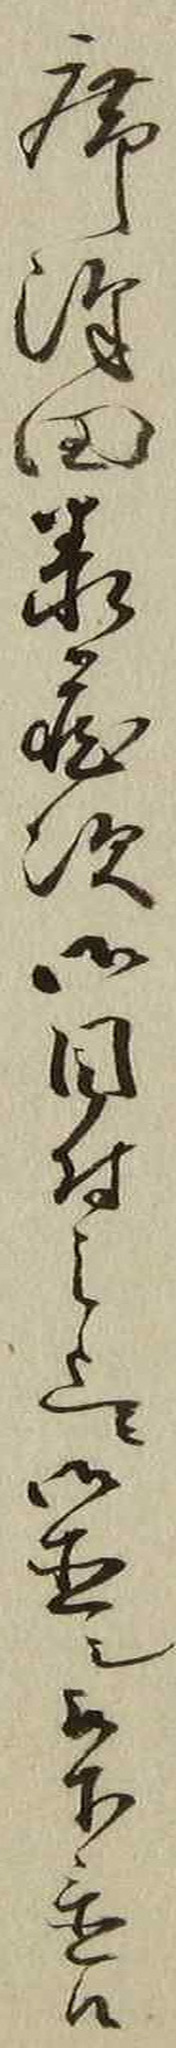席澤田泰蔵次御目付之上に御直し被下置候
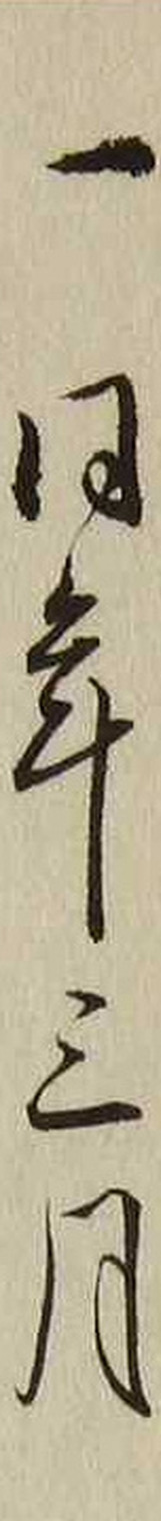一同年三月
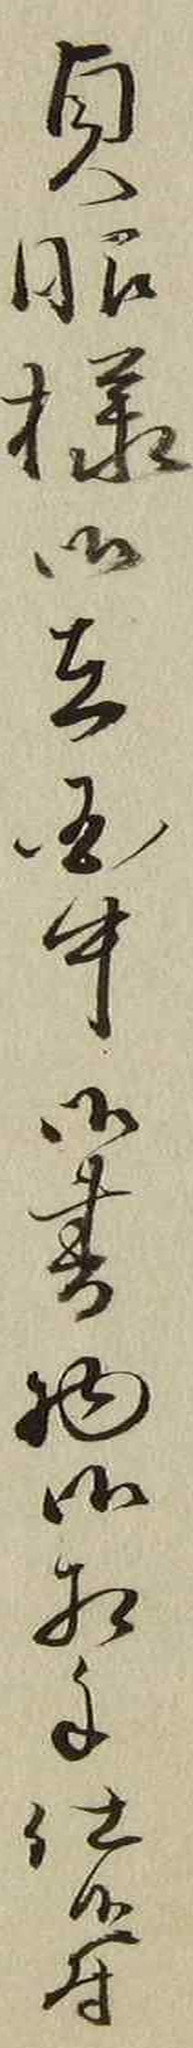貞昭様御在国中御書物御相手仕候に付
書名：諸士系譜　巻之3　い之部3
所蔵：会津若松市立会津図書館
